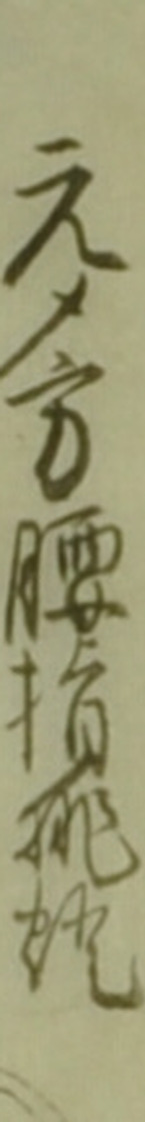元〆方腰指挑燈
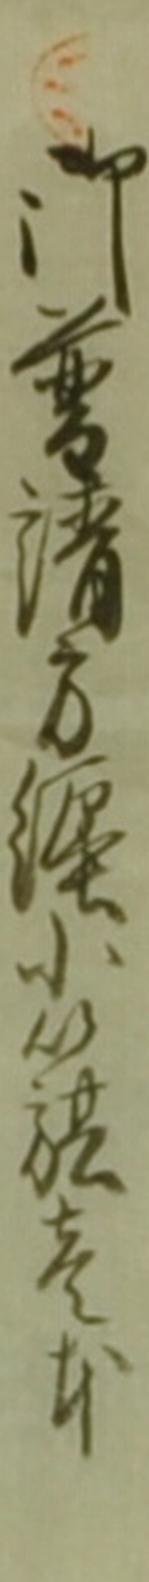御普請方纏小籏壱本
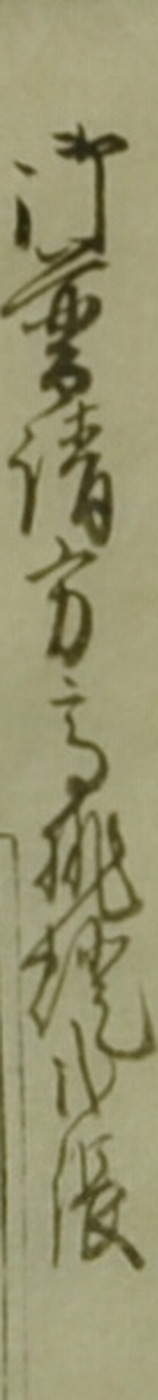御普請方高挑燈弐張

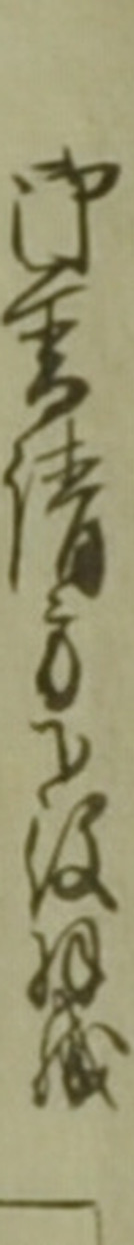御普請方下役羽織
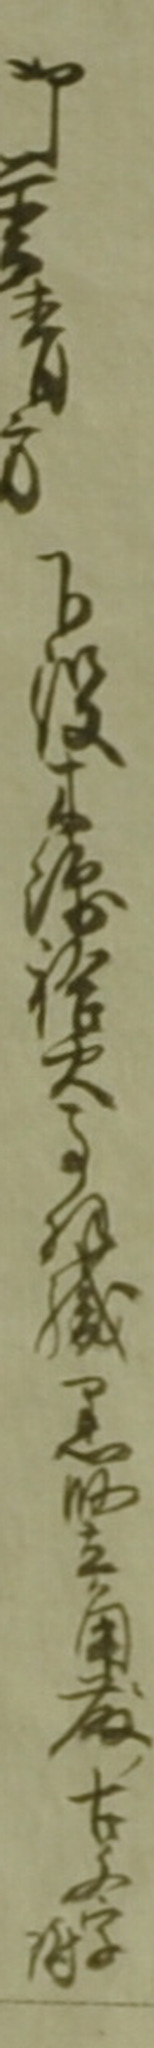御普請方下役木綿袷火事羽織黒堅角藤ノ古文字

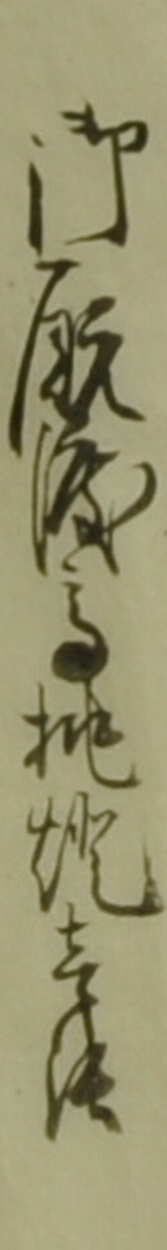御厩渡高挑燈壱張
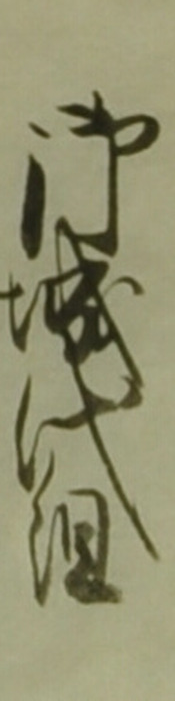御城代組
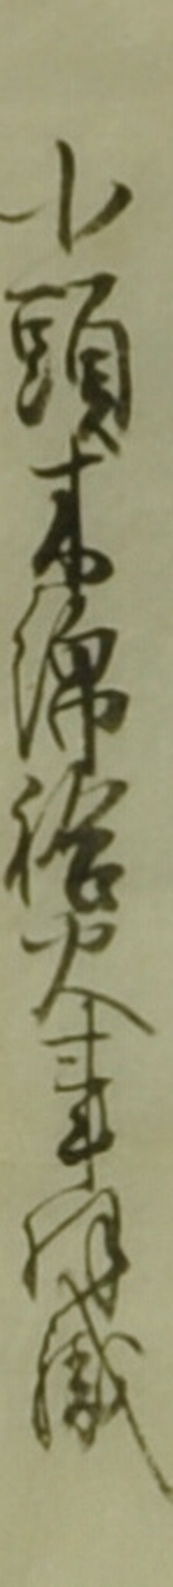小頭木綿袷火事羽織
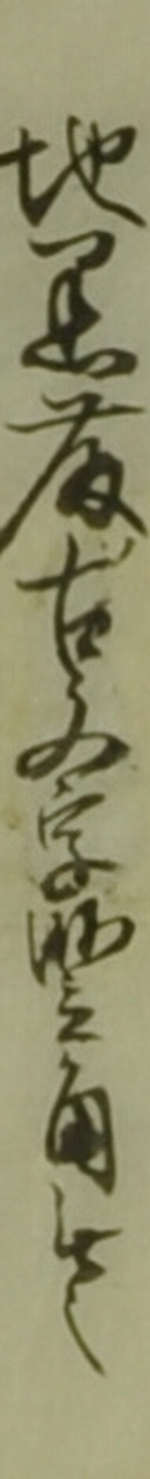地黒藤ノ古文字堅角無之
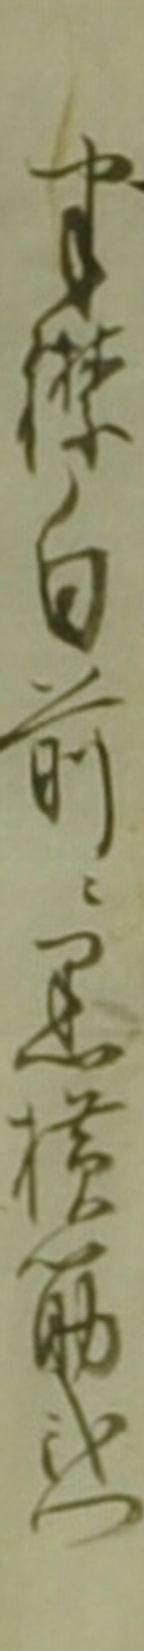半襟白前二黒横筋弐つ
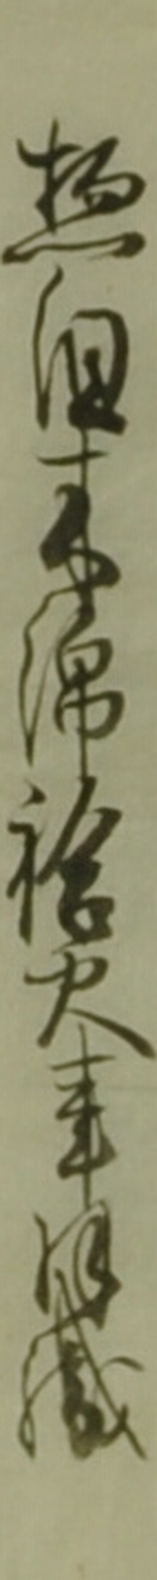惣組木綿袷火事羽織
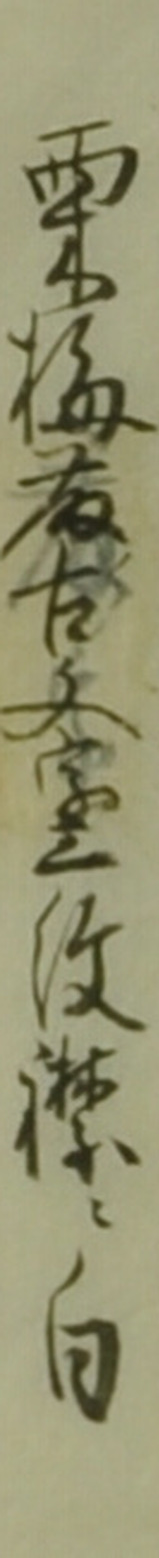栗梅藤古文字三紋襟二白
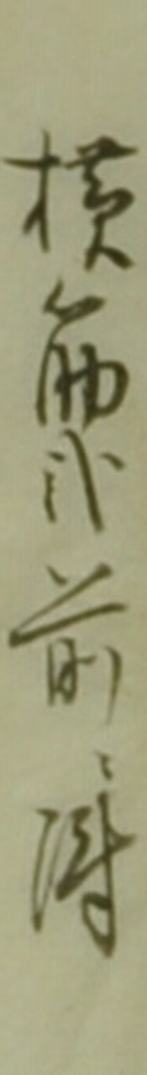横筋弐前二附

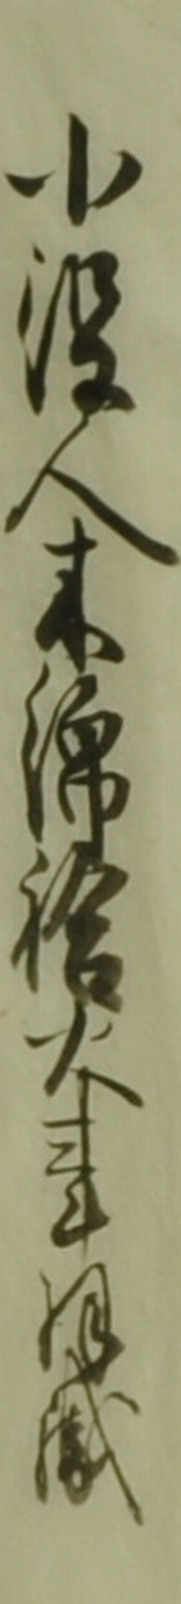小役人木綿火事羽織
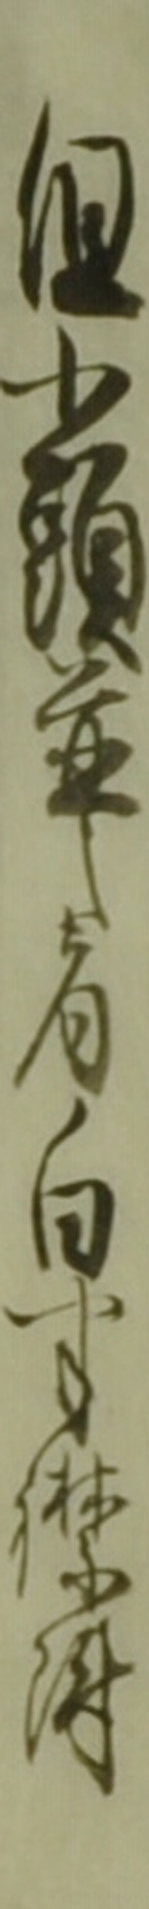組小頭並之者白半襟附
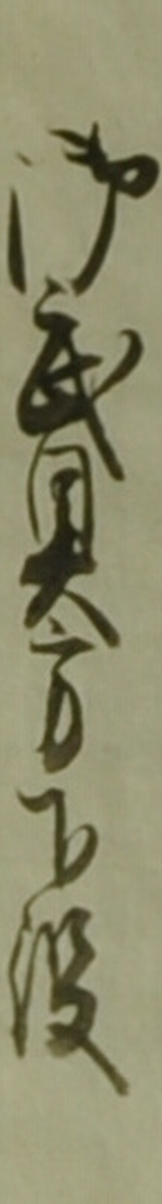御武具方下役
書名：諸向御相印定法帳
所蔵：伊那市立高遠町図書館・合同会社AMANE
